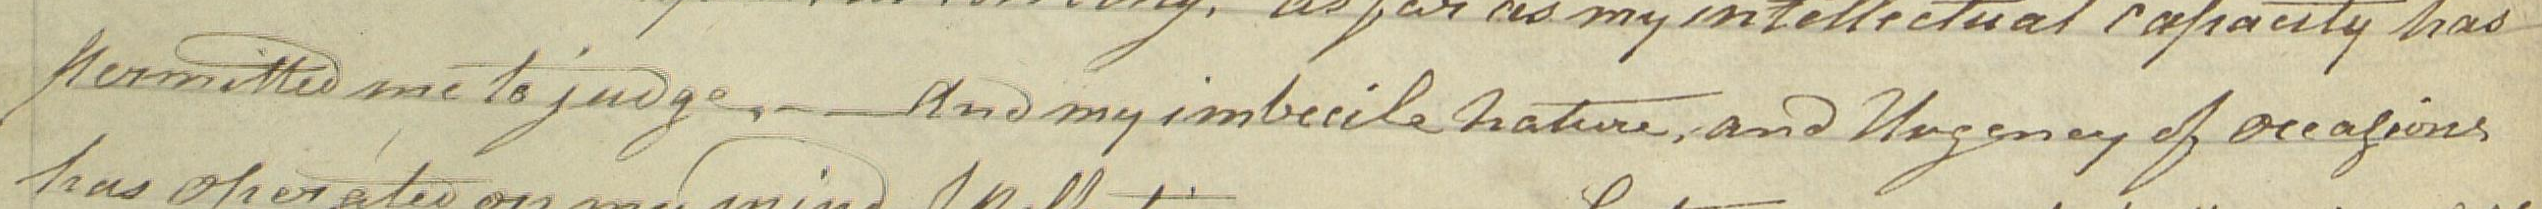permitted me to judge. And my imbecile Nature, and Urgency of occasions
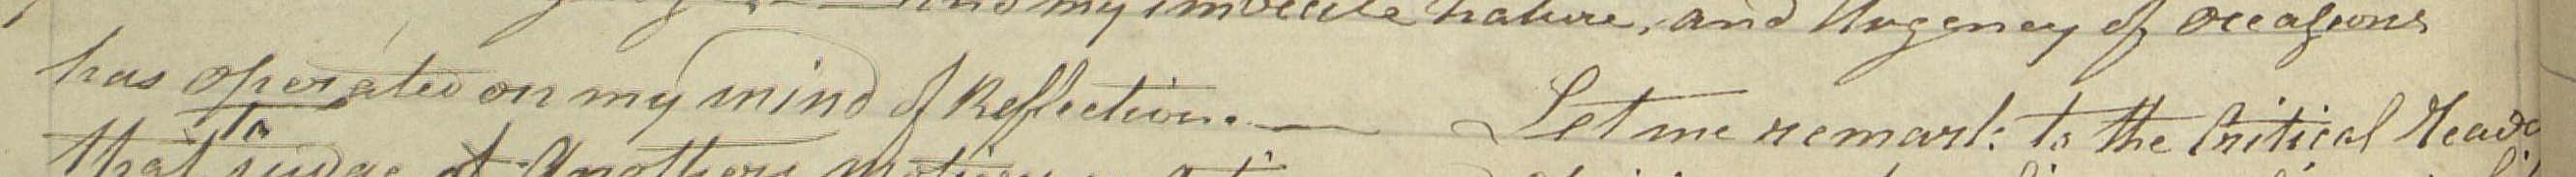has operated on my mind of Reflection. Let me remark to the Critical Reas-
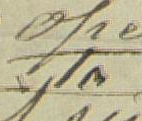to
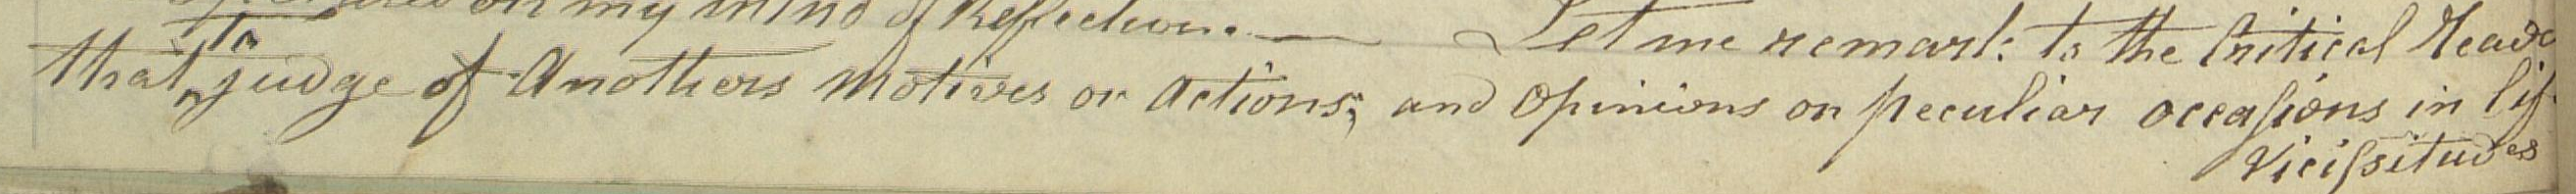that ^ judge of Anothers Motives or Actions; and Opinions on peculiar occasions in lif-
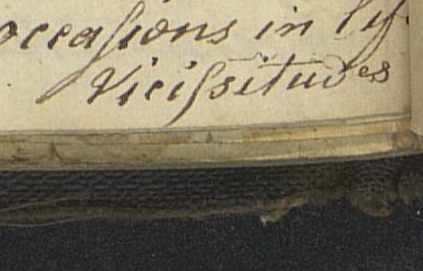Vicissitudes
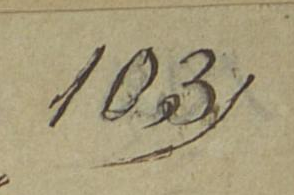103
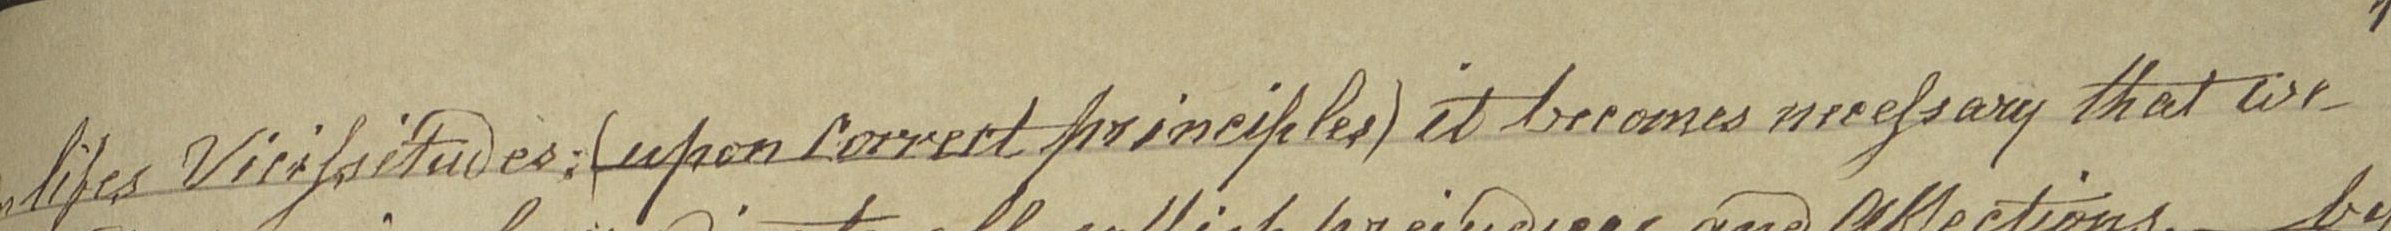in lifes Vicissitudes: (upon correct principles) it becomes necessary that we
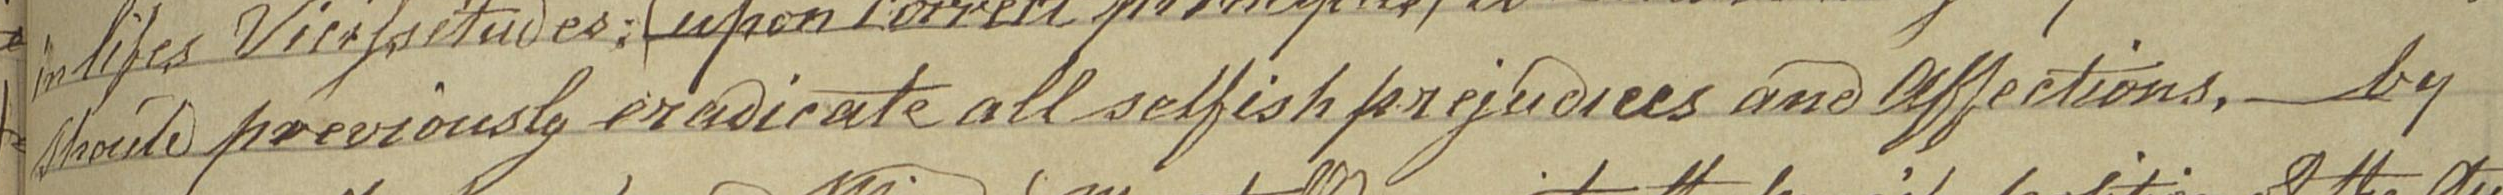should previously eradicate all selfish prejudices and Affections, by
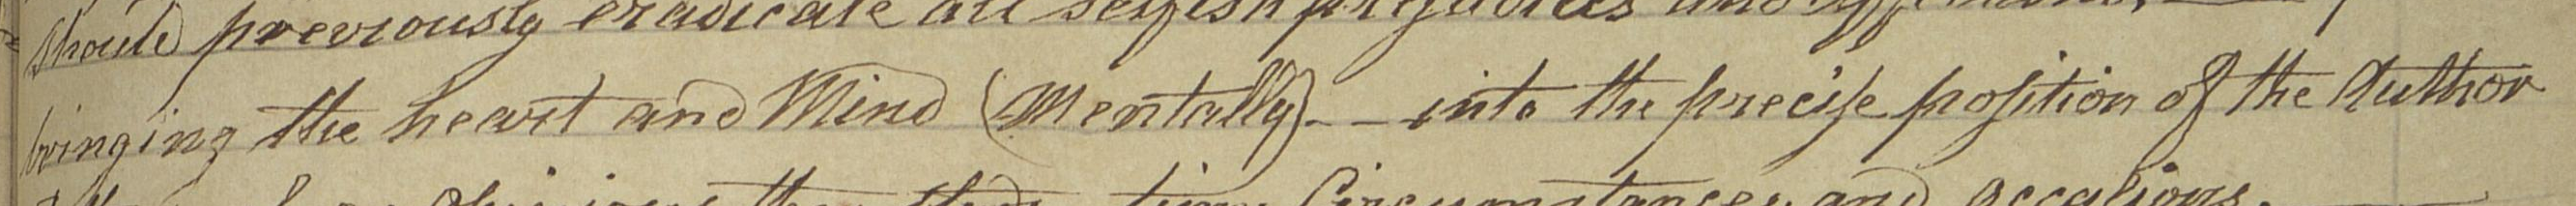bringing the heart and Mind (mentally) into the precise position of the Author
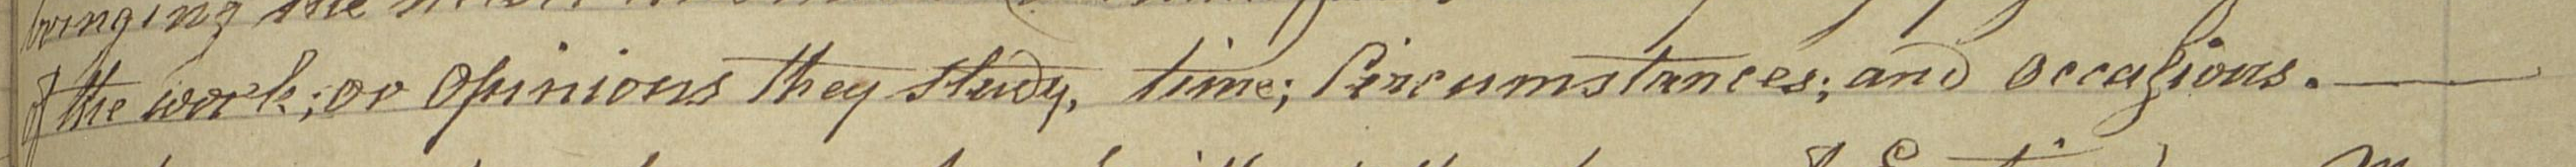of the work; or opinions they study, time; Circumstances; and occasions.
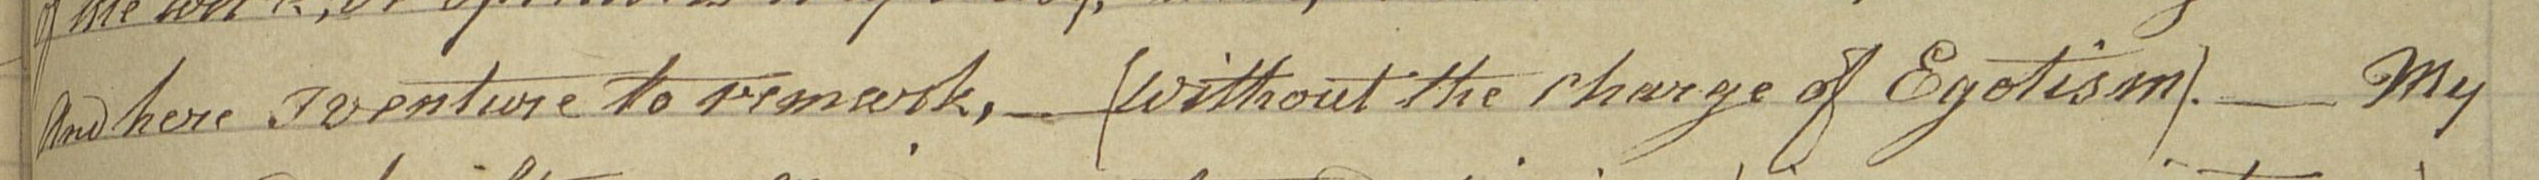And here I venture to remark, (Without the charge of Egotism). My
